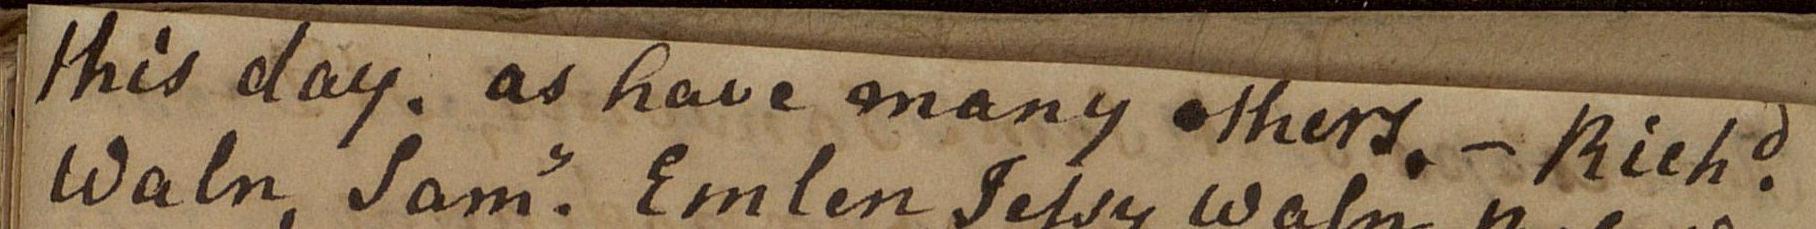this day. as have many others,- Rich^d.
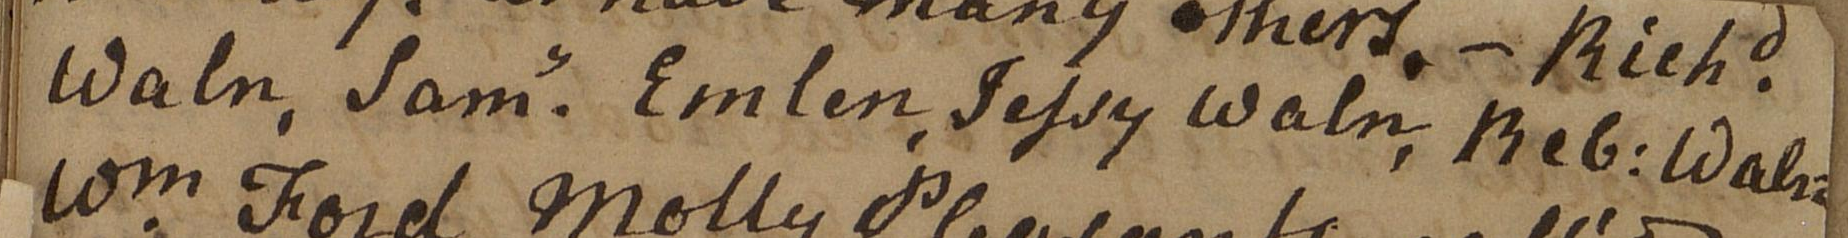Waln, Sam^y. Emlen, Jessy Waln, Reb: Wal[r]
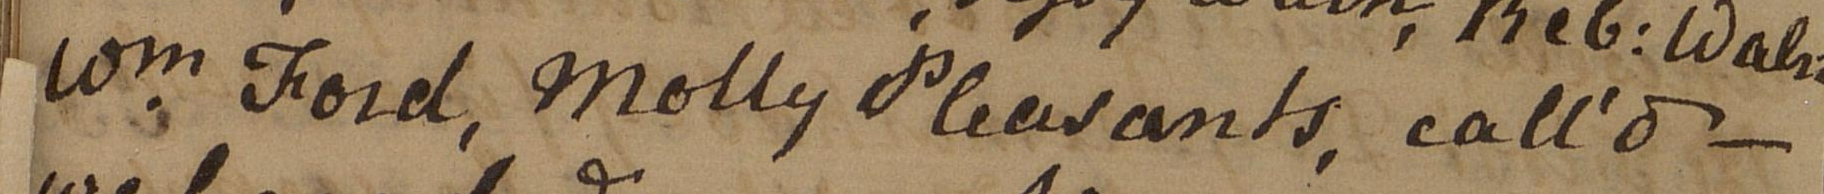W^m. Ford, Molly Pleasants, call'd-
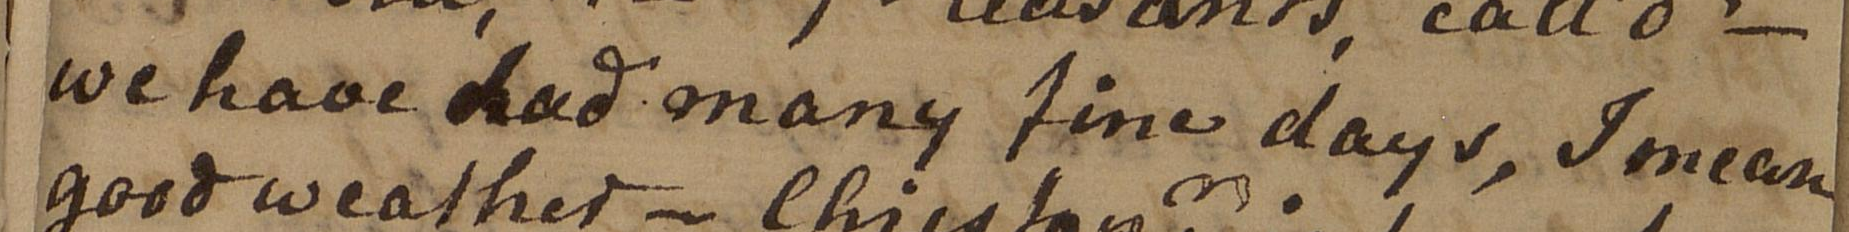we have had many fine days, I mean
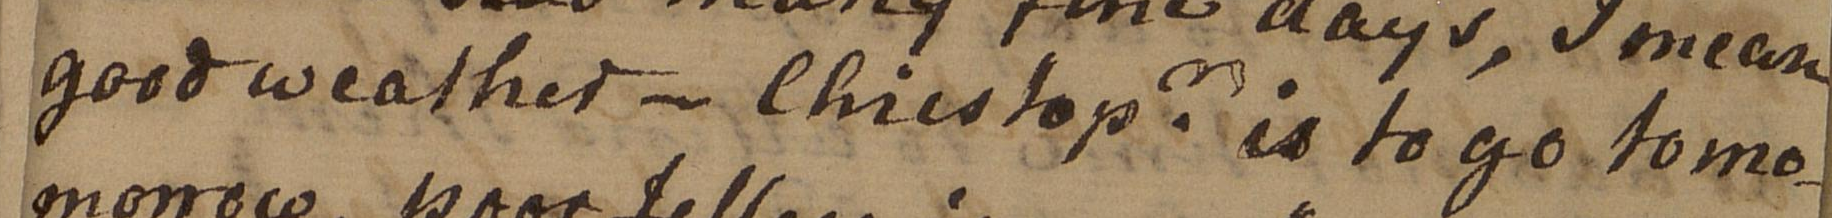good weather- Christop^r. is to go tomo-
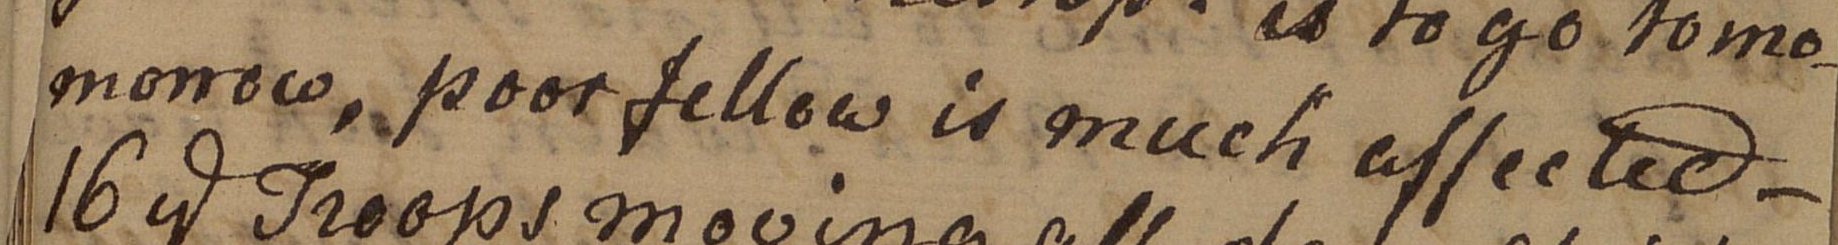morrow, poor fellow is much affected-
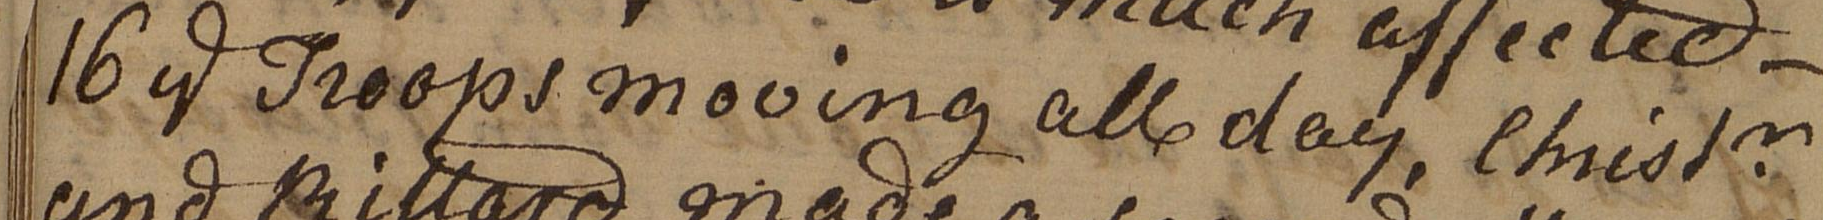16 y^e Troops moving all day, Christ^r.
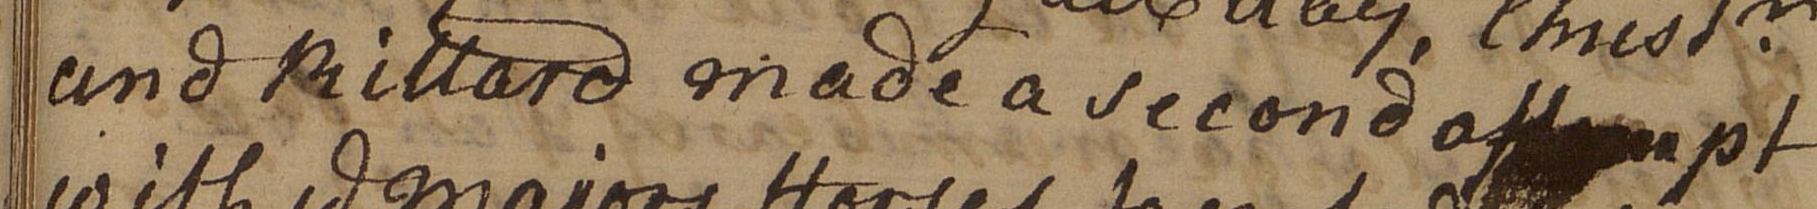and Rittard made a second attempt
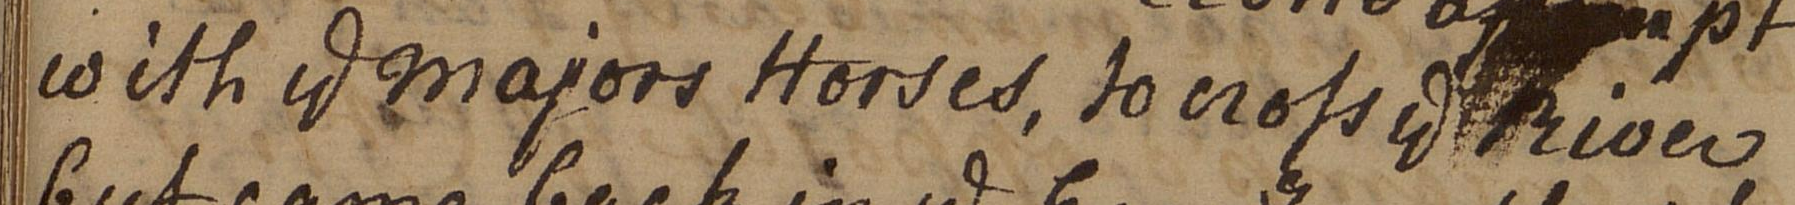with y^e majors Horses, to cross y^e River
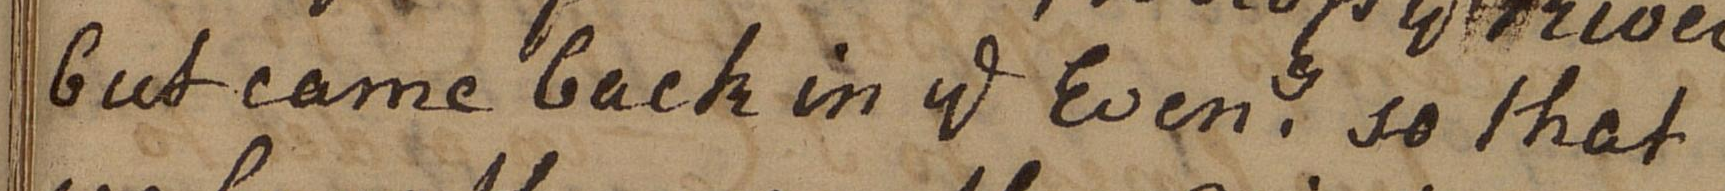but came back in y^e Even^g. so that
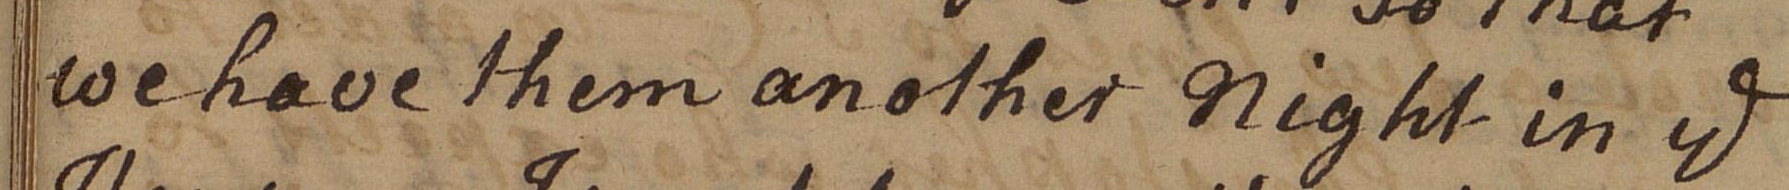we have them another Night in y^e
